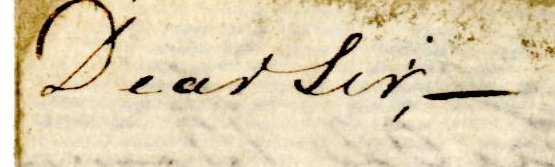Dear Sir,-
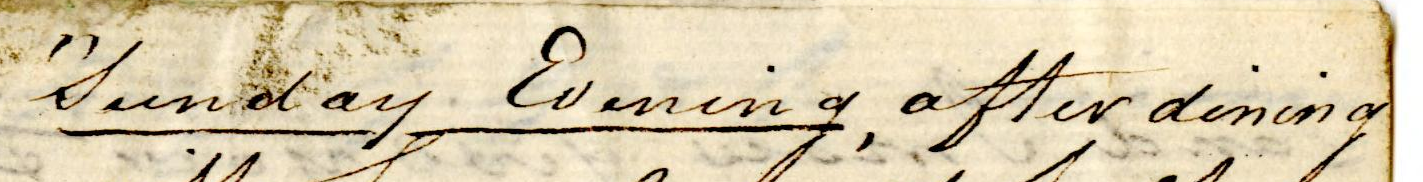Yesterday Evening, after dining
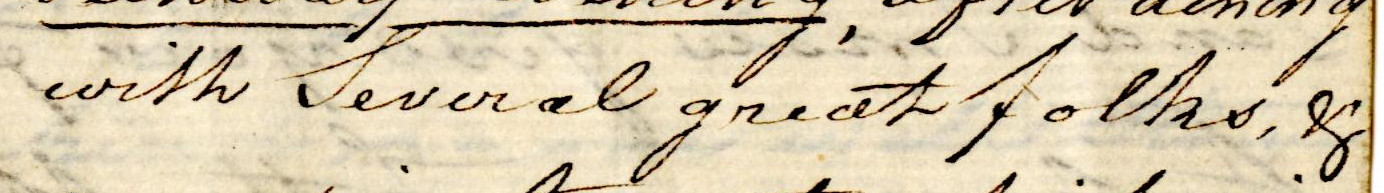with Several great folks, &
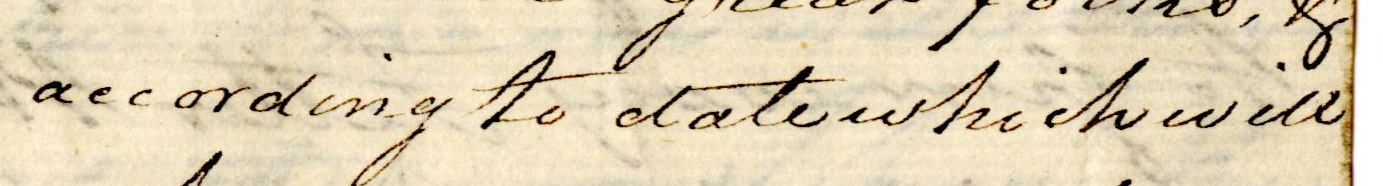according to date which will
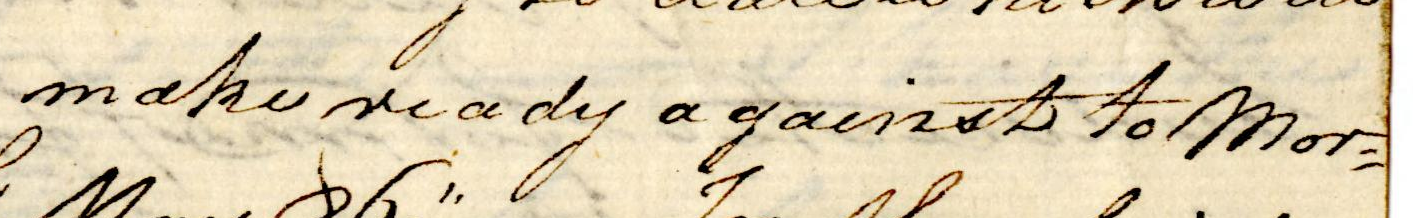make ready against tomor-
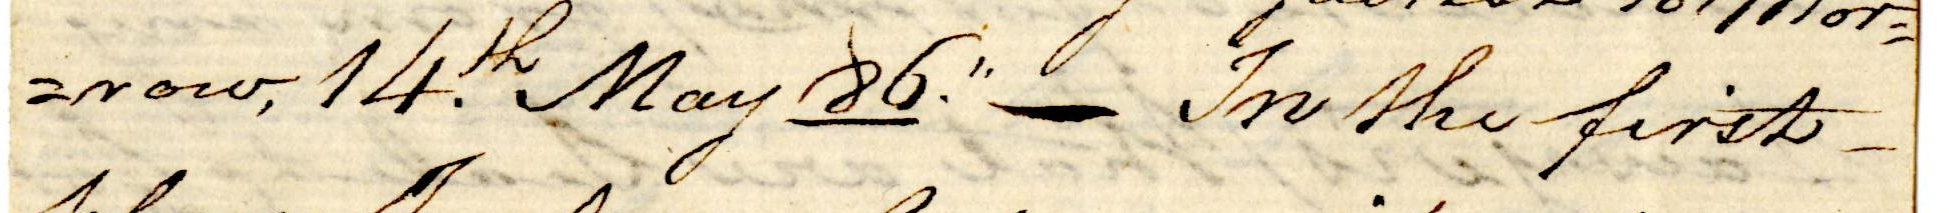-row, 14^th May 86"- In the first
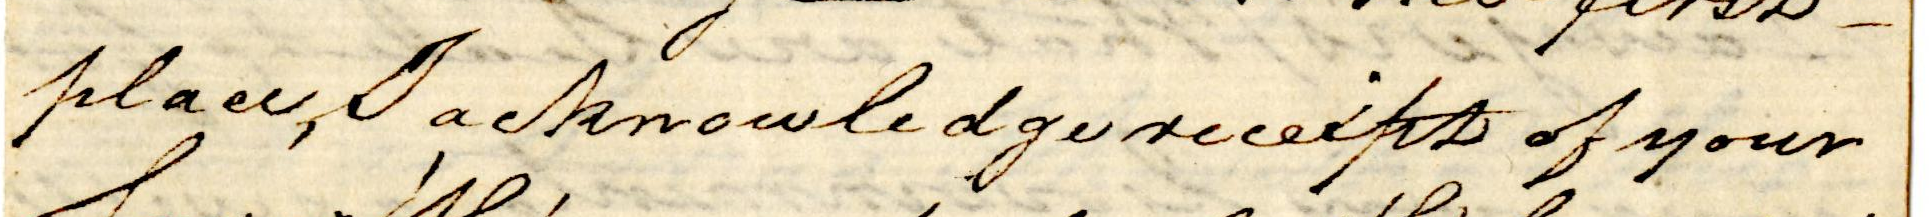place, I acknowledge receipts of your
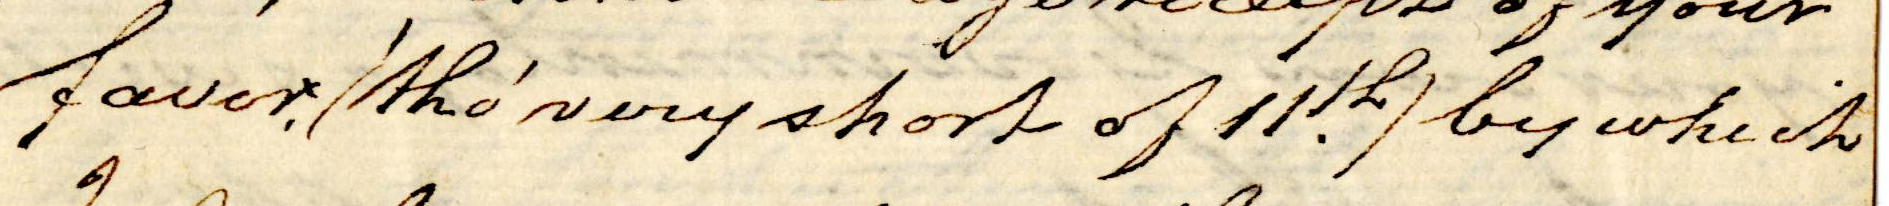favor, (tho' very short of 11^th.) by which
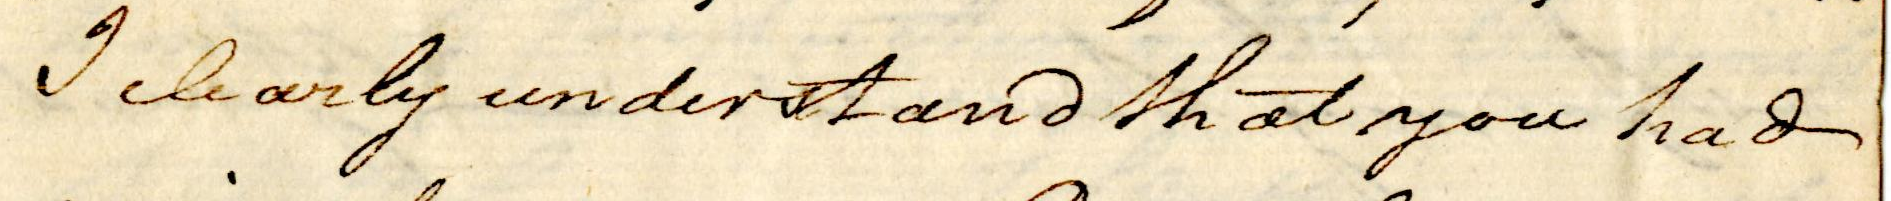I clearly understand and that you had
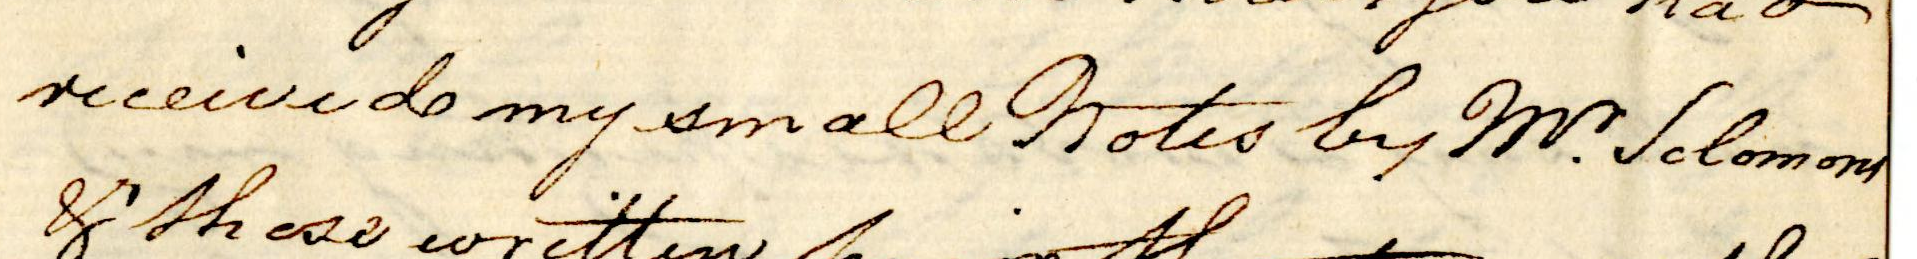received my small notes by M^r solomon
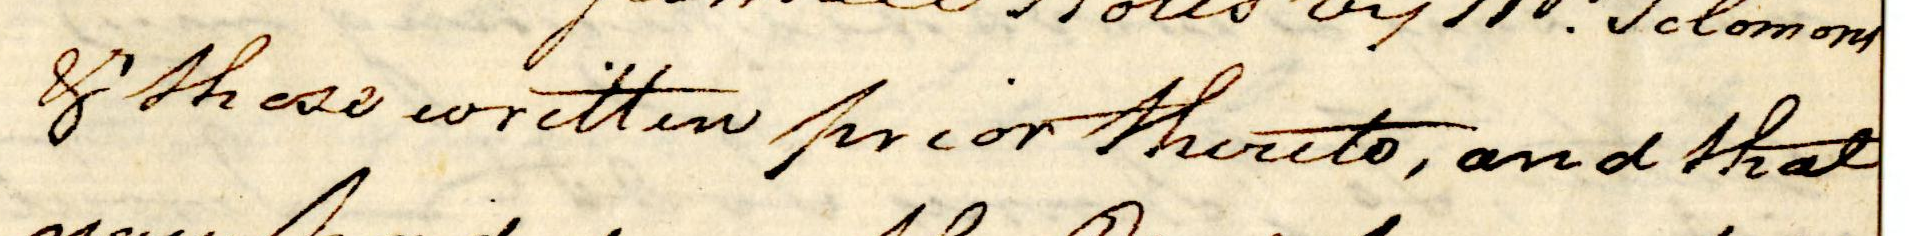& these written prior thereto, and that
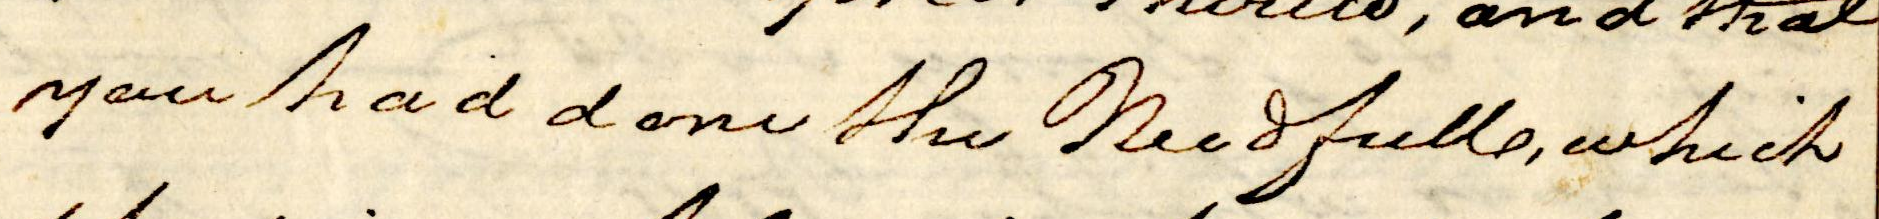you had done the need Needfull, which
